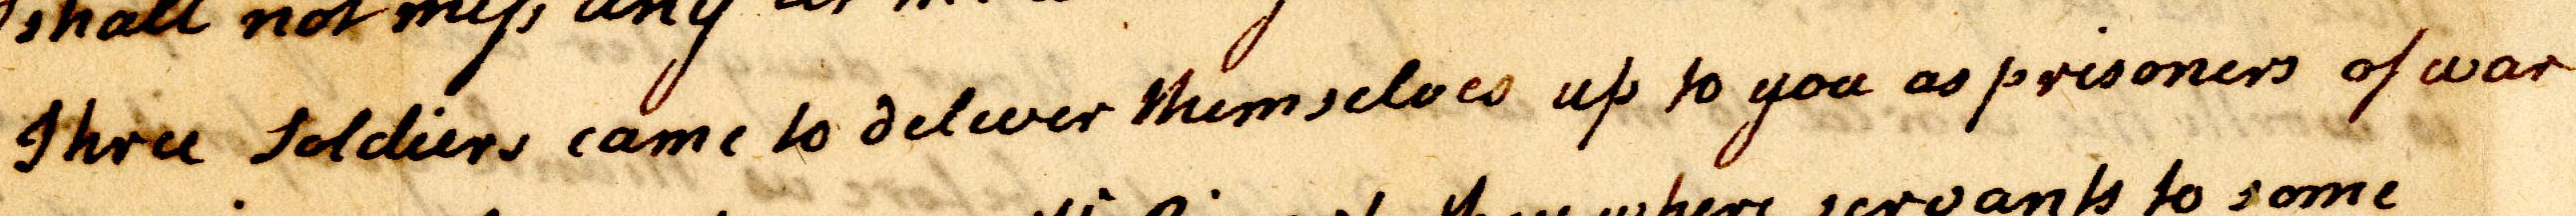Three soldiers came to deliver themselves up to you as prisoners of war
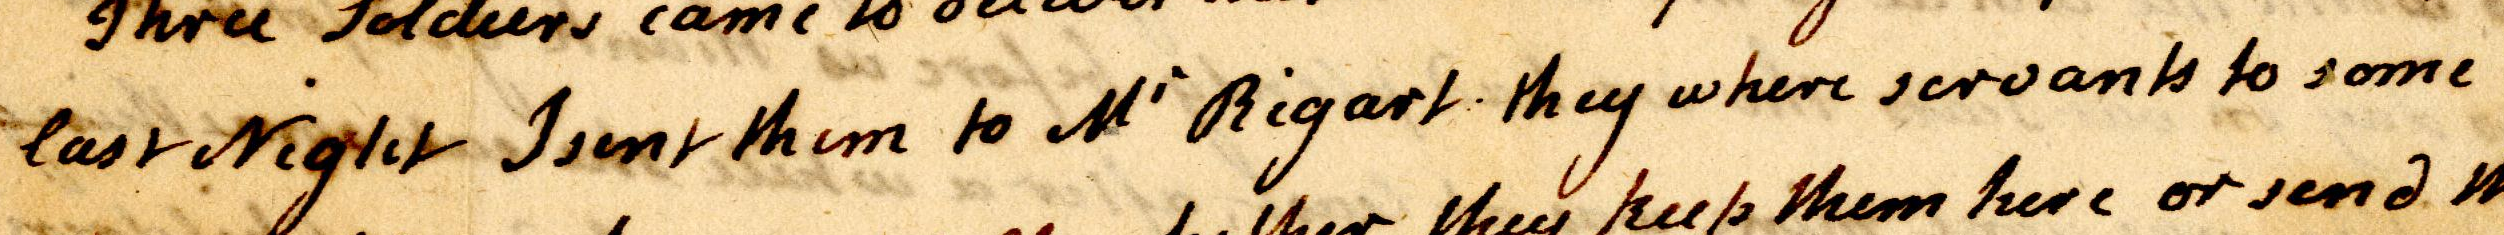last Night I sent them to M^r Rigart they where servants to some
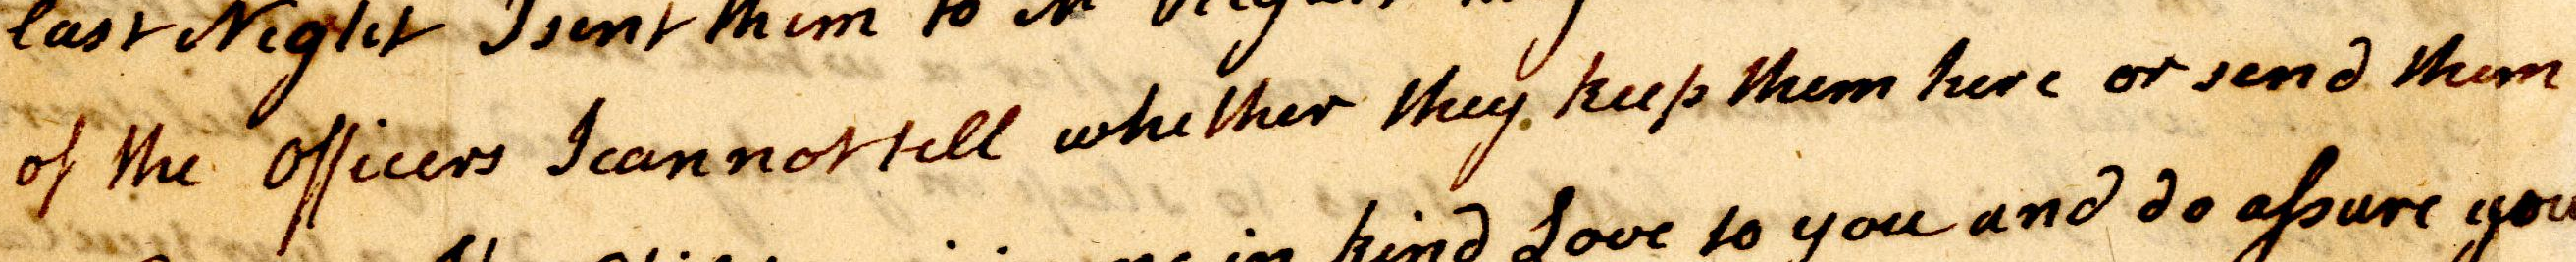of the officers I cannot tell whether they keep them here or send them
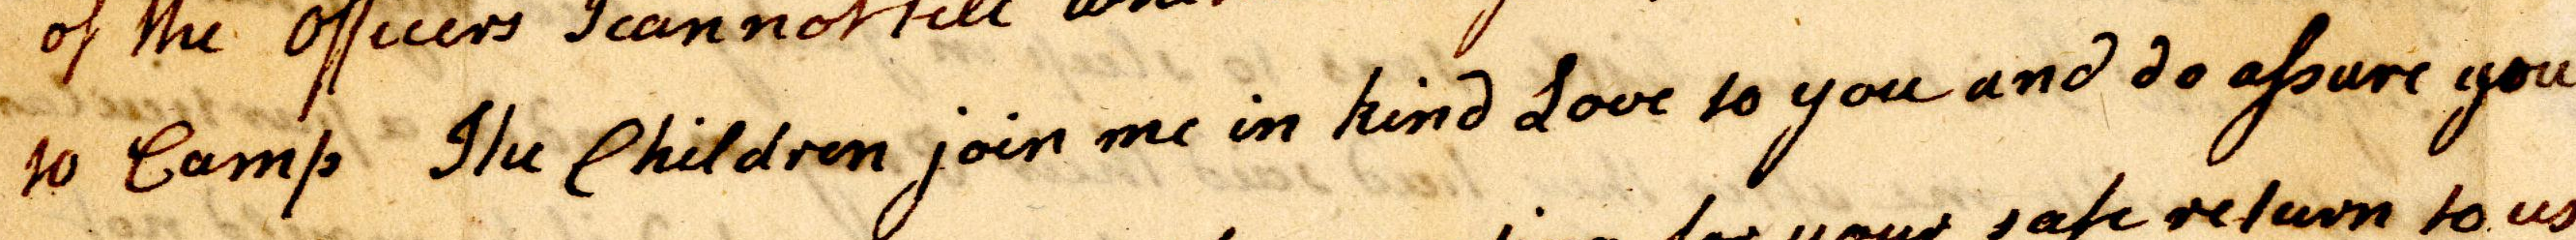to Camp The Children join me in kind Love to you and do assure you
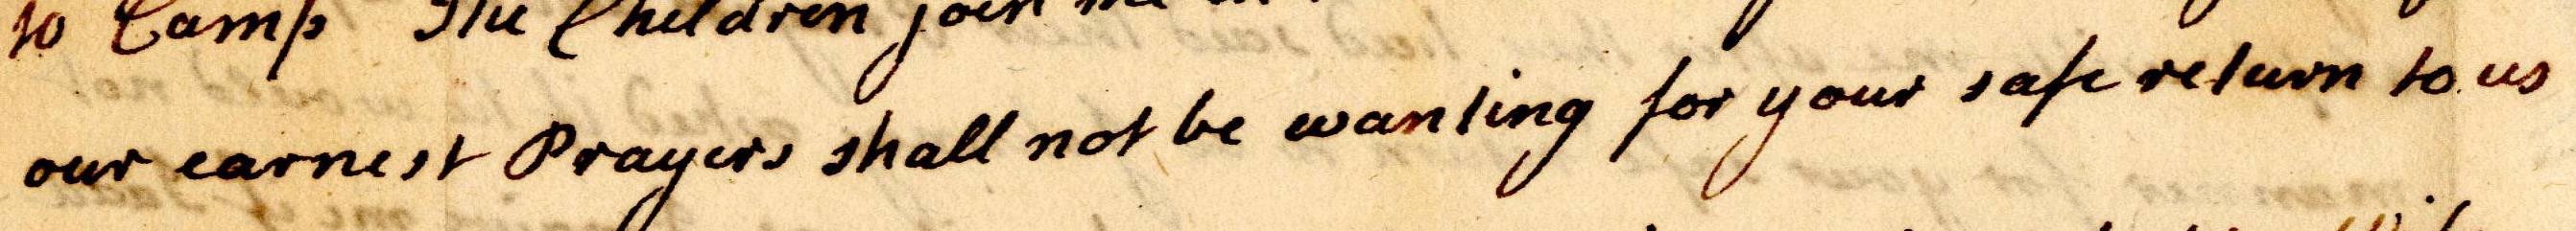our earnest Prayers shall not be wanting for your safe return to us
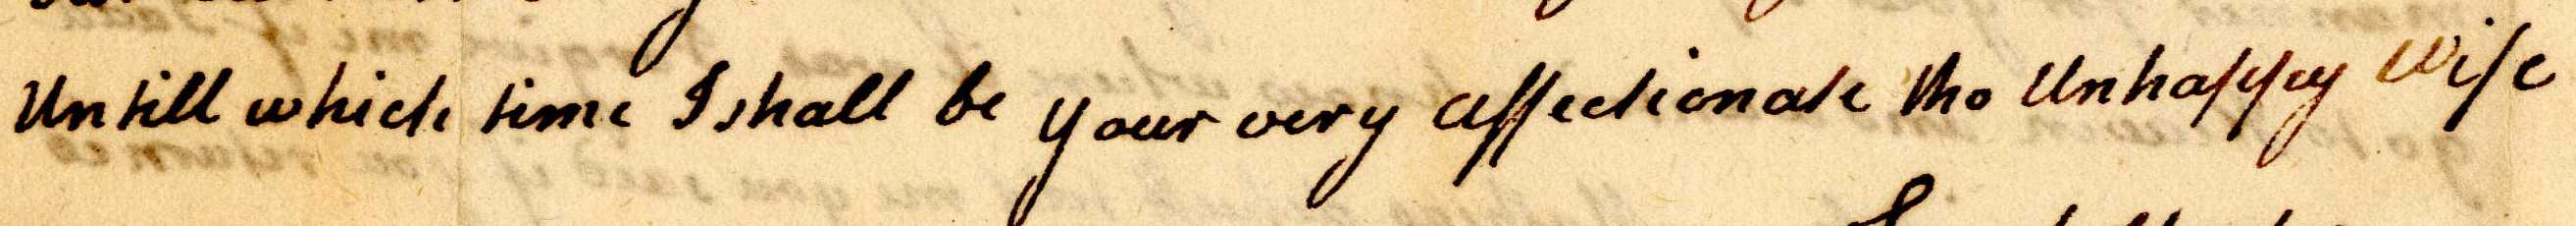Untill which time I shall be your very affectionate tho Unhappy Wife
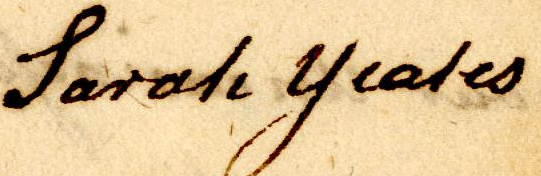Sarah Yeates
